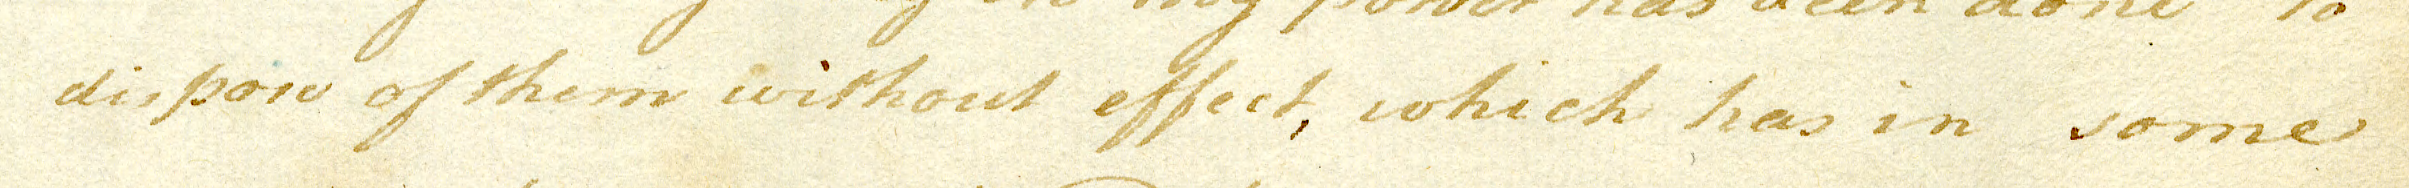dispose of them without effect, which has in some
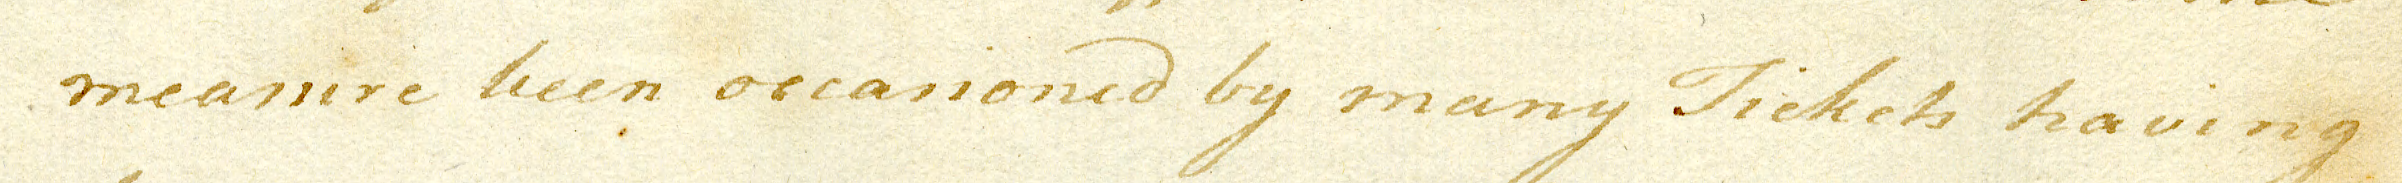measure been occasioned by many Tickets having
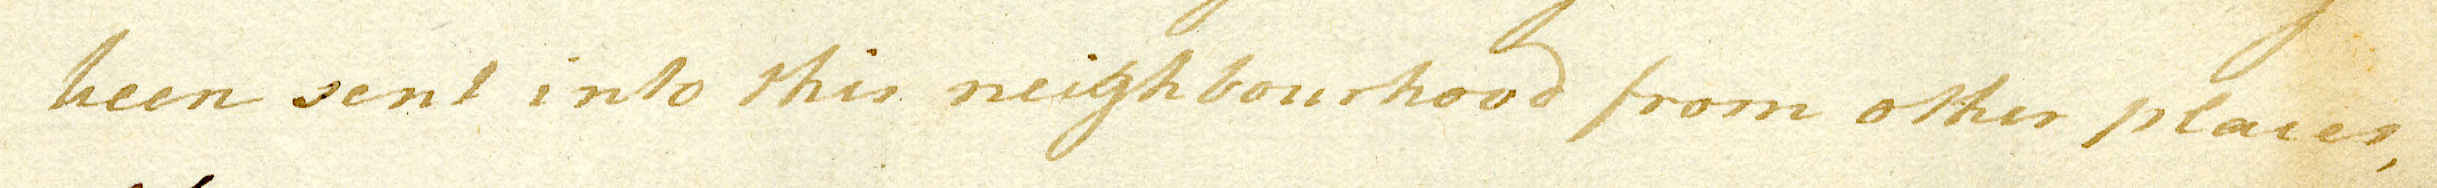been sent into this neighbourhood from other places,
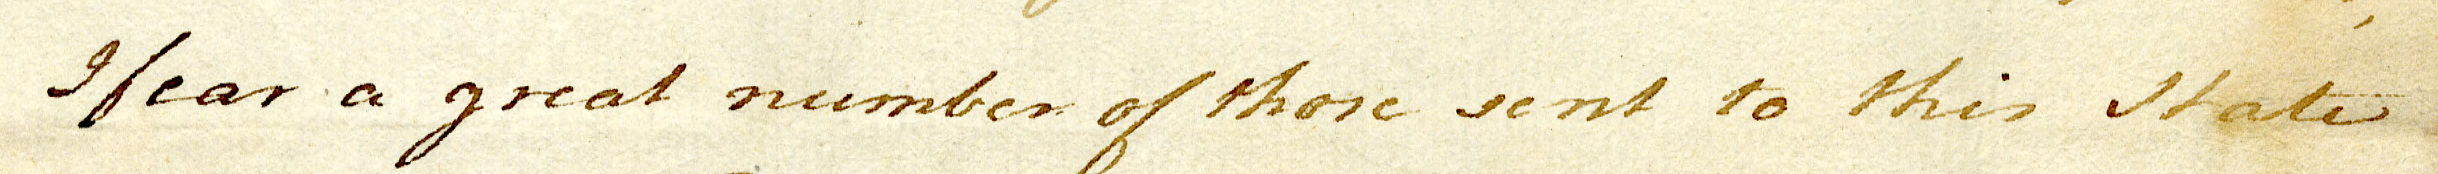I fear a great number of those sent to this state
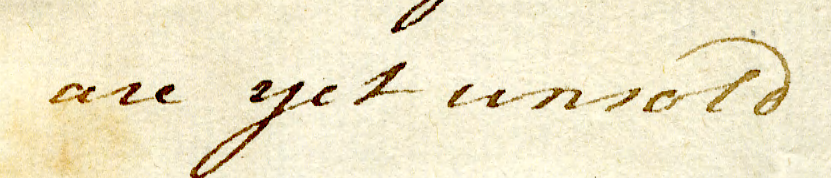are yet unsold
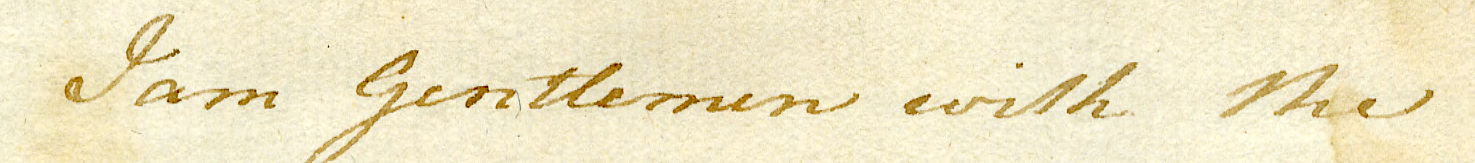I am Gentlemen, with the
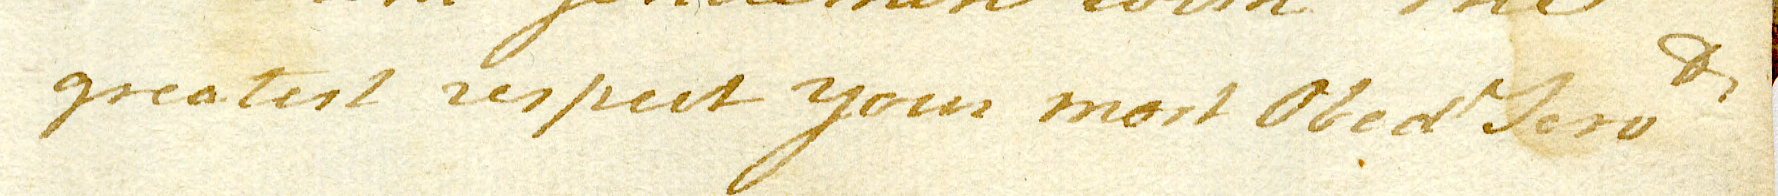greatest respect your most Obed Serv^t
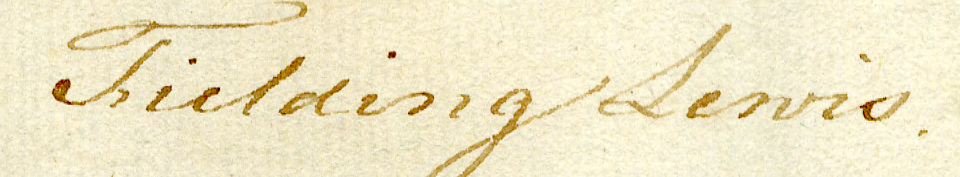Fielding Lewis
